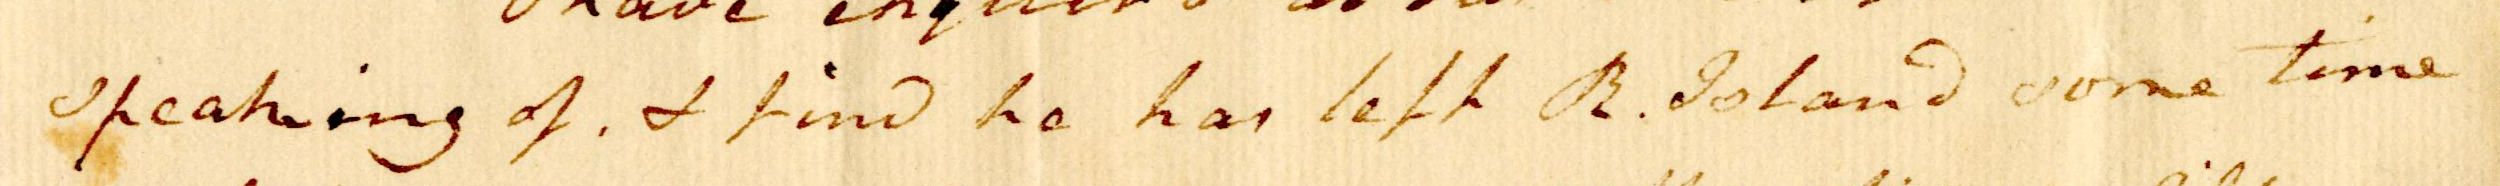speaking of, & find he has left R. Island some time
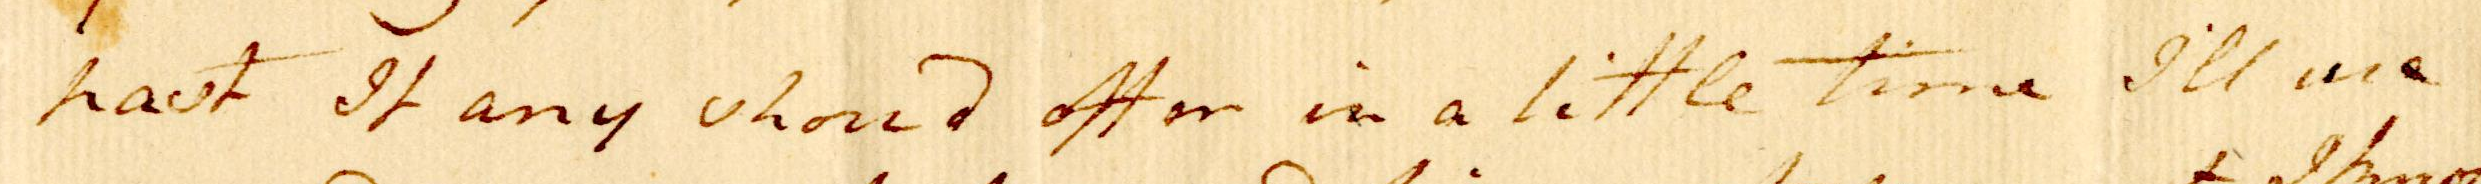past If any shou'd offer in a little time I'll use
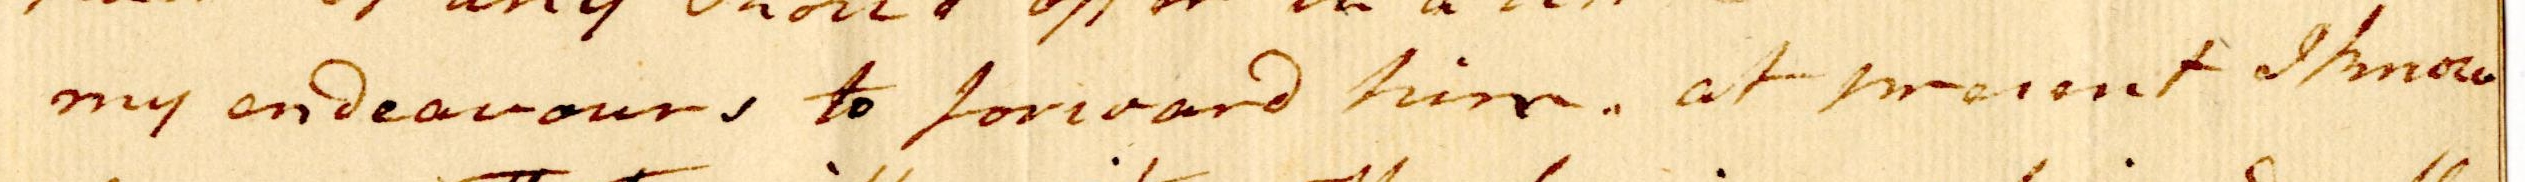my endeavours to forward him, at present I know
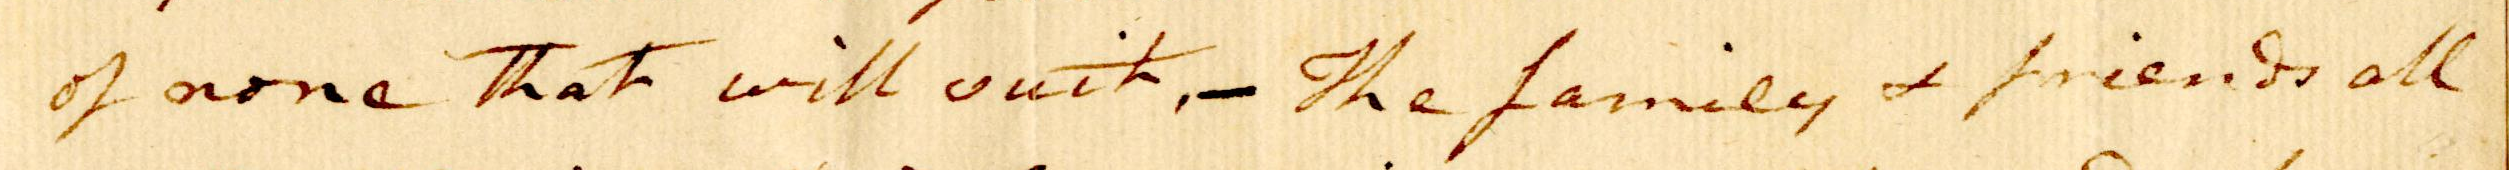of none that will suit,- The family & friends all
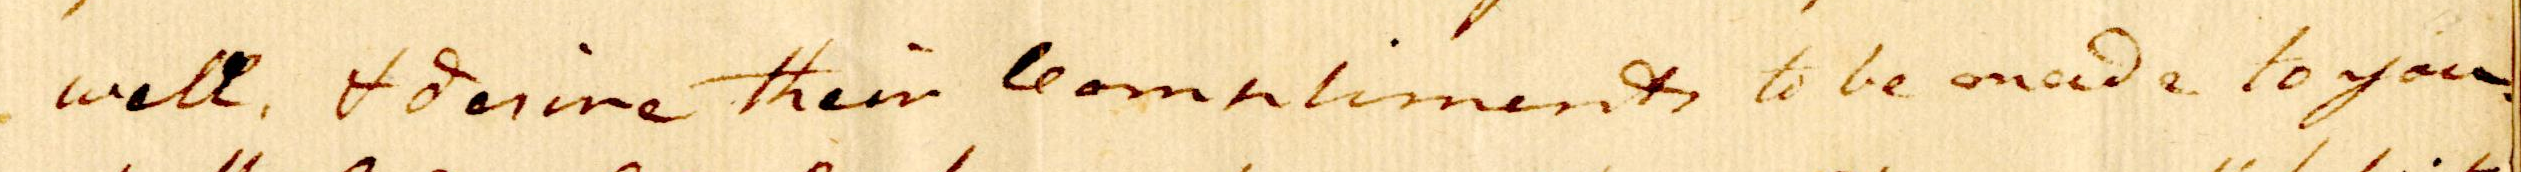well. & desire their Comntiments to be made to you
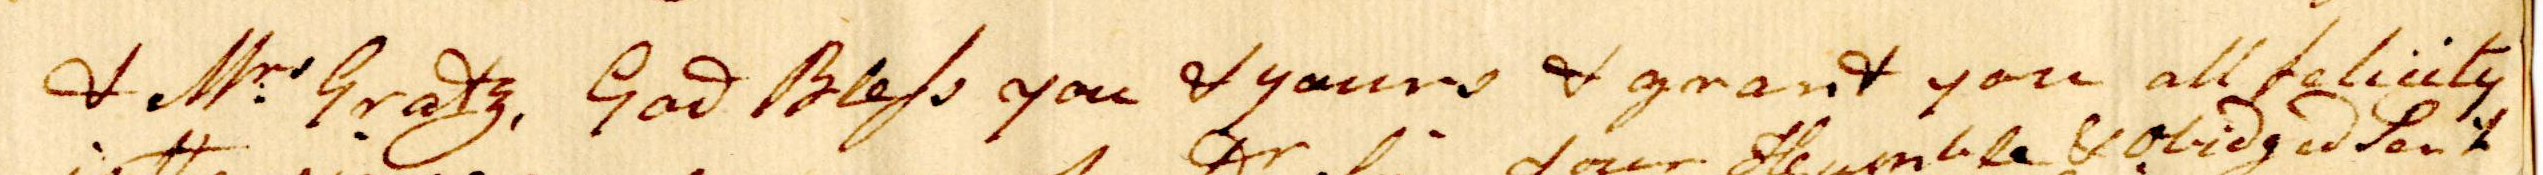& M^rs. Gratz, God Bless you & yours & grant you all felicity
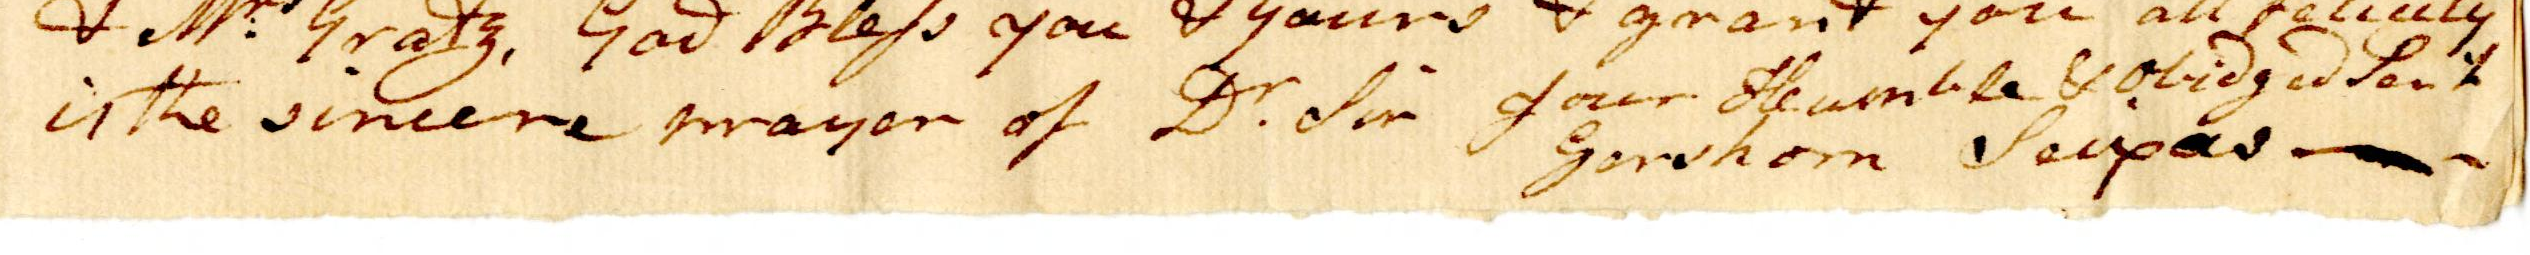is the sincere prayer of D^r. Sir your Humble & oblidged ser^t
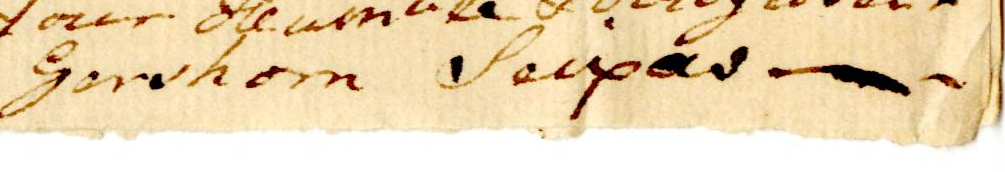Gershom Seixas
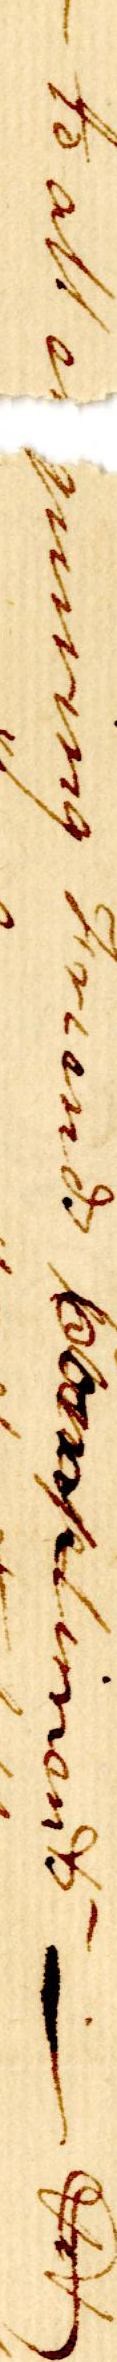to all enquiring Friends Compliments.-
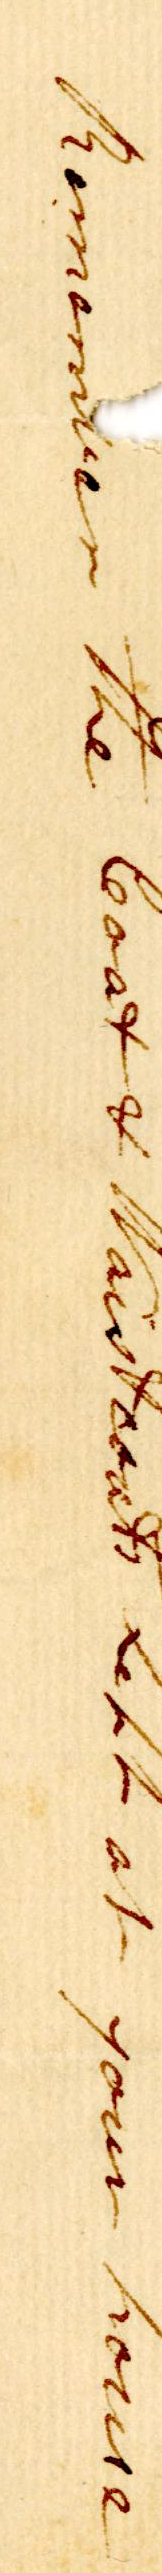Remember the Coat & Waistcoats Left at your house
